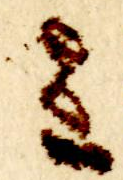100
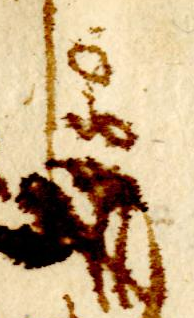£800
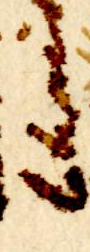Chair
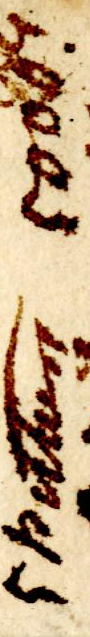5 Patterns 5000.
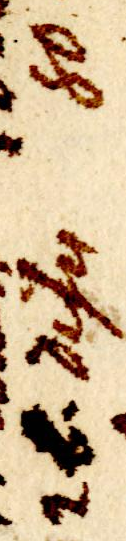28. dises 80
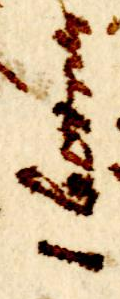1 Corner
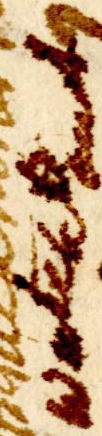watch out
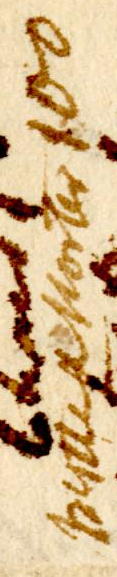Butte a Morter 100
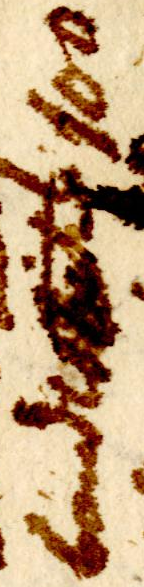[_______] 10l
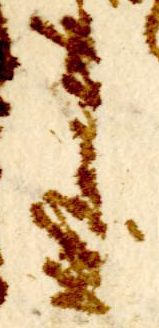[______]
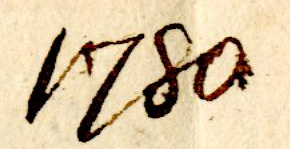1780
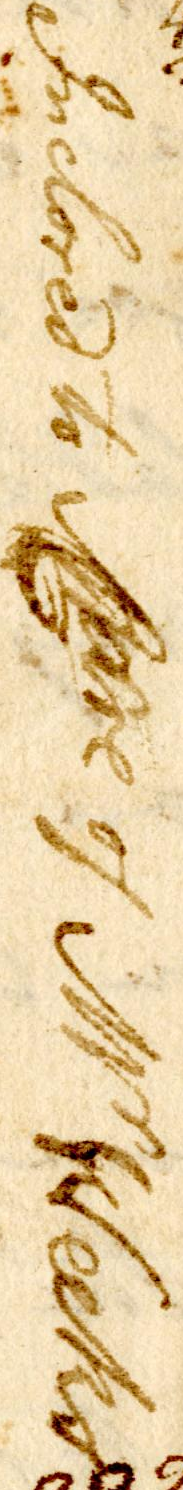Inclosed to Care of M^r Weeks
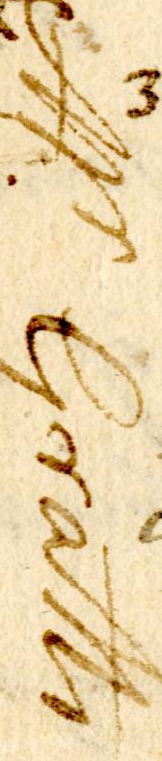M^r. Gratts
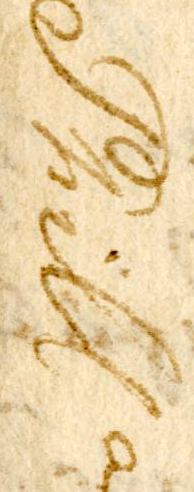Phill^a
